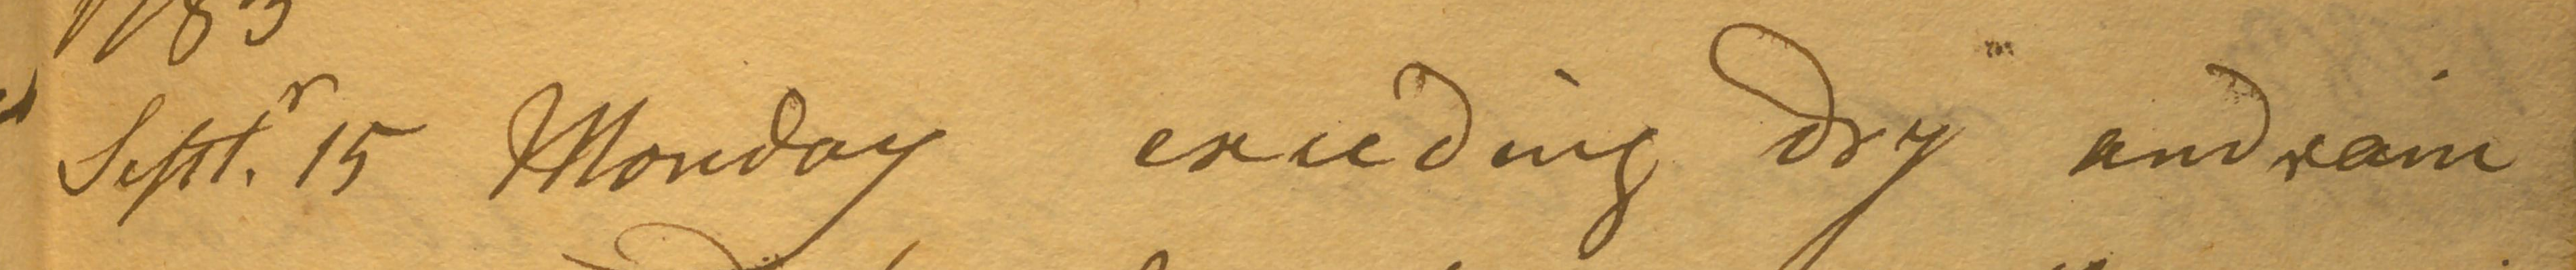Sept^r. 15 Monday exceding dry and rain
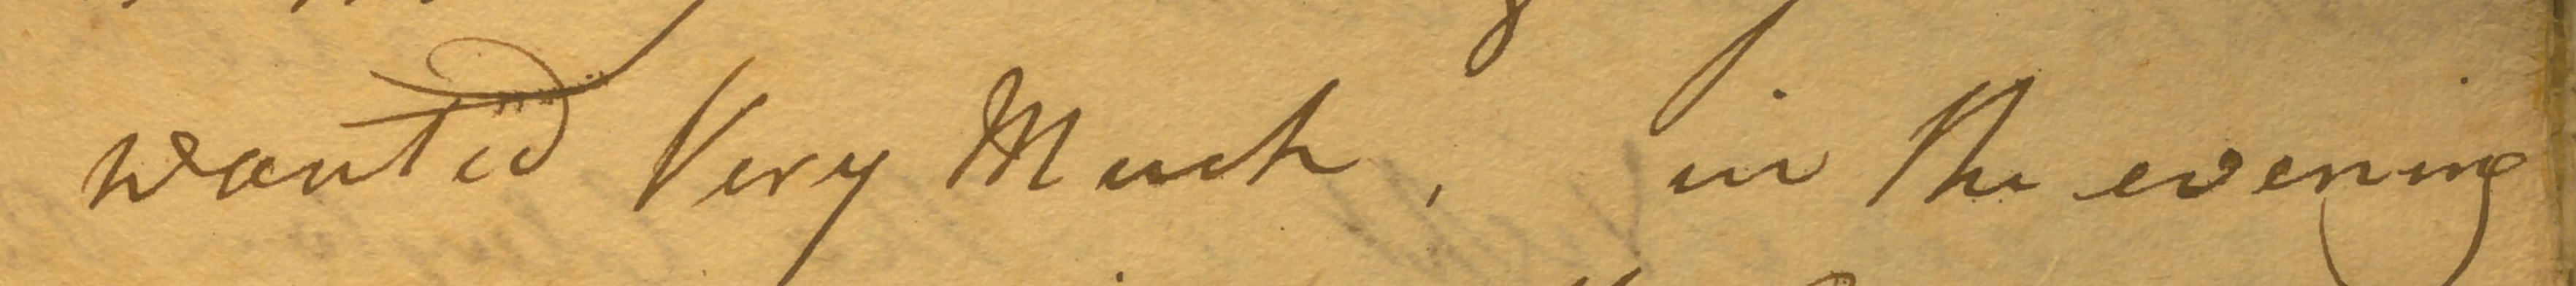wanted Very Much, in the evening
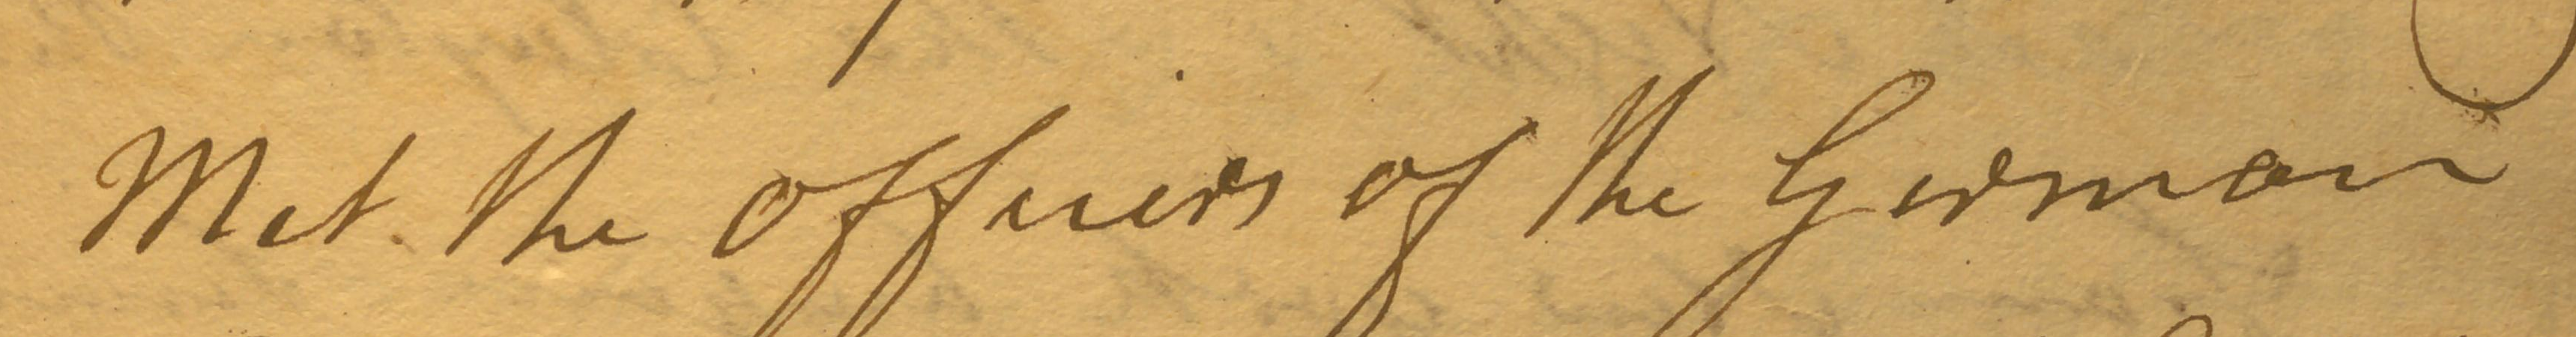Met. the officers of the German
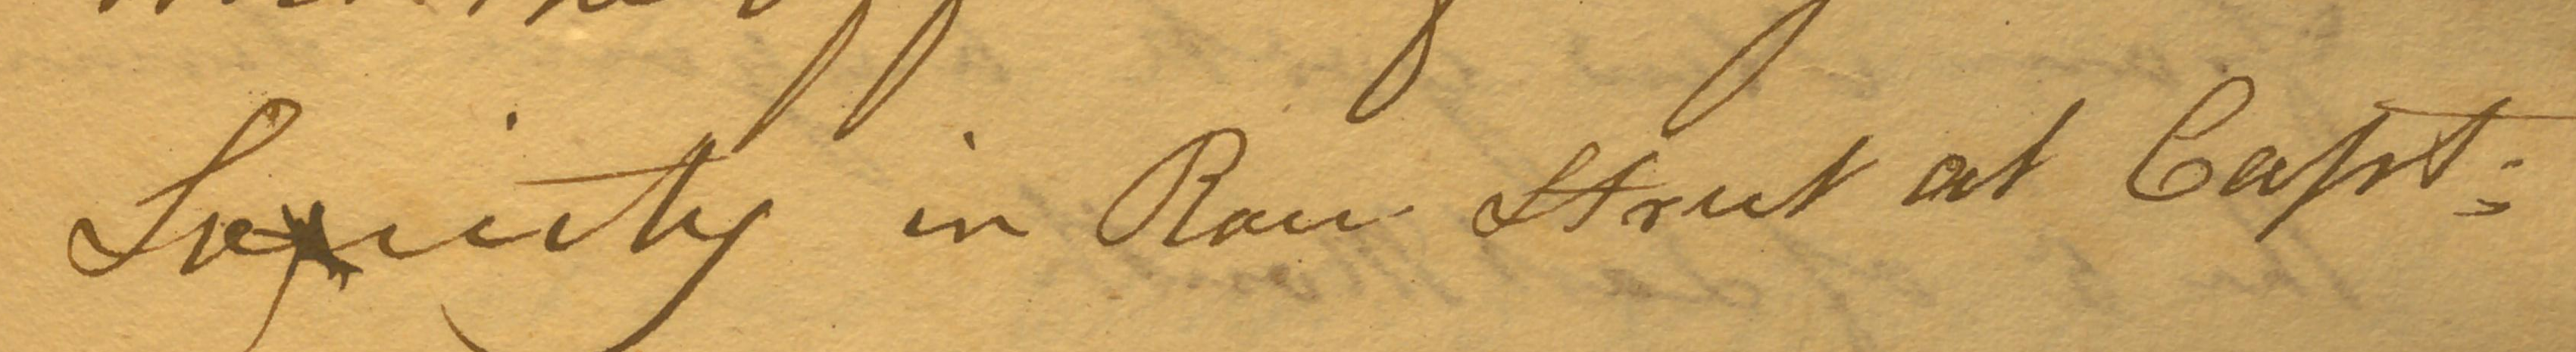Society in Race Street at Capt:
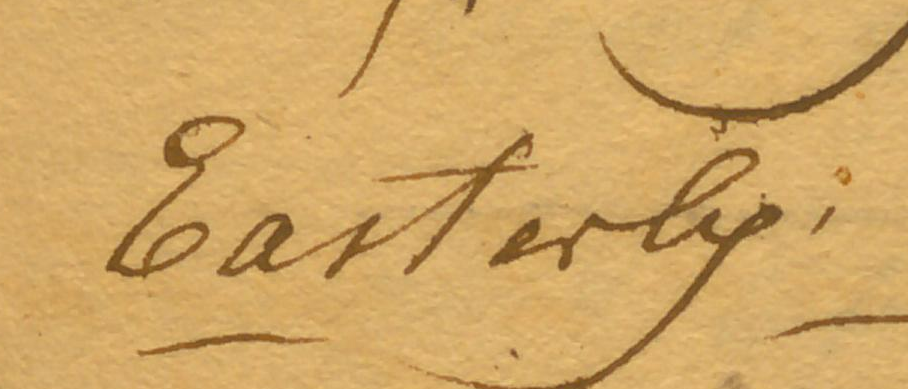Easterly
